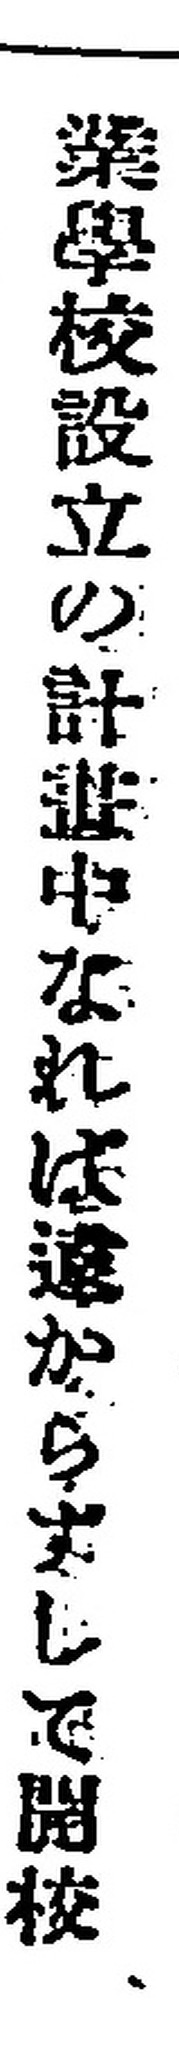業学校設立の計画中なれば遠からずして開校
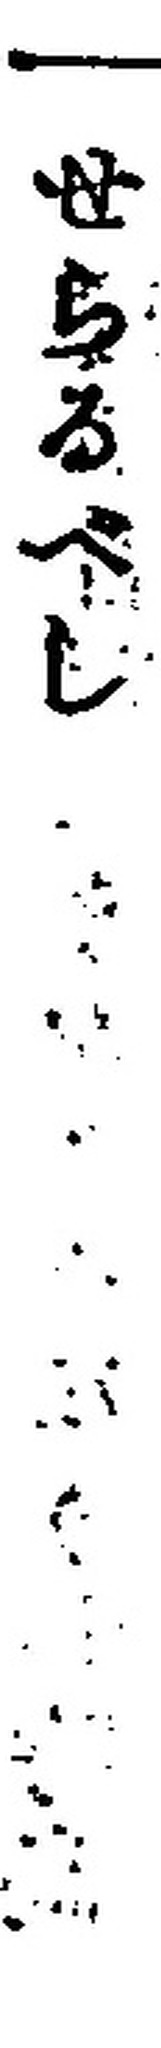せらるべし
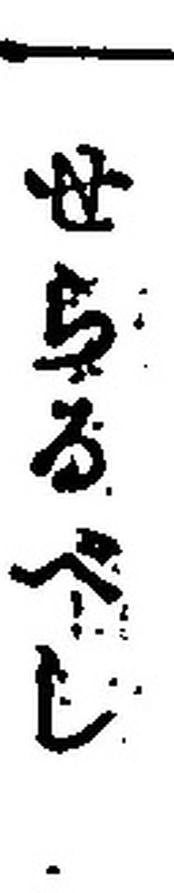せらるべし
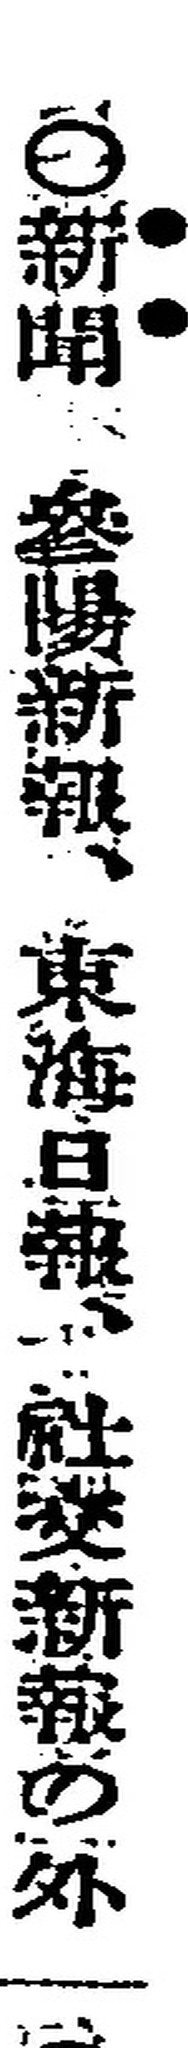○新聞参陽新報、東海日報、社交新報の外
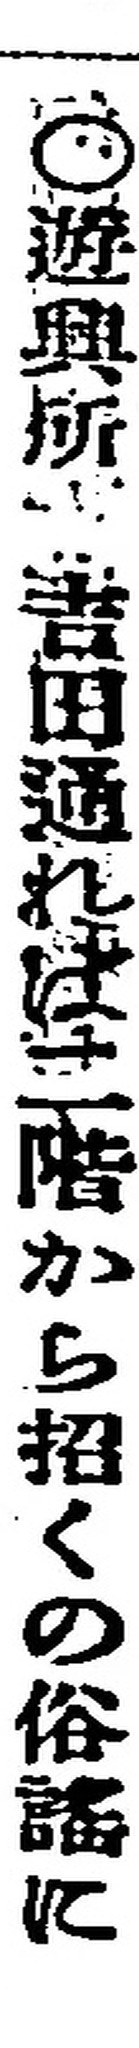○遊興所吉田通れば二階から招くの俗謡に
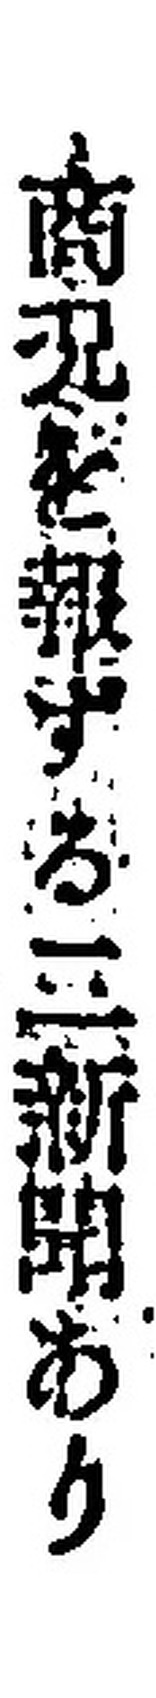商況を報ずる二新聞あり
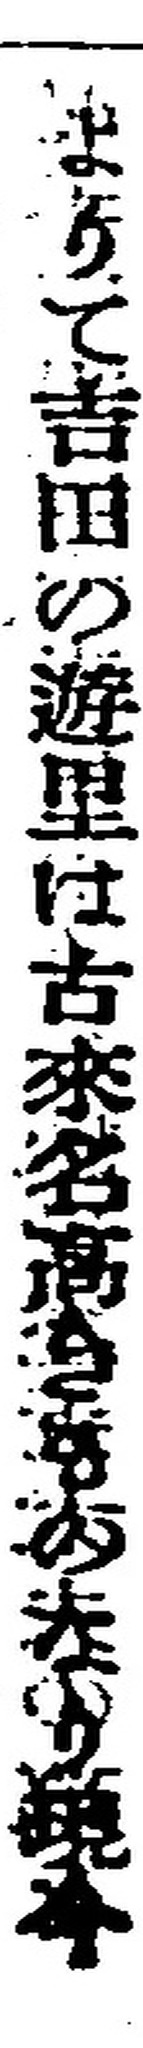よりて吉田の遊里は古来名高きものなり現今
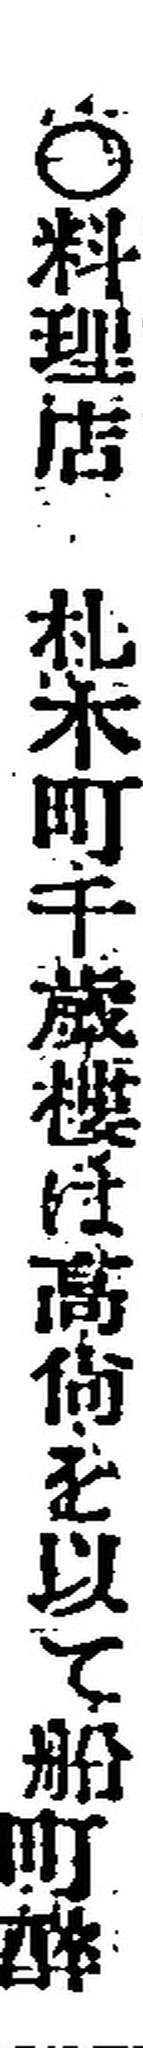○料理店札木町千歳楼は高尚を以て船町酔
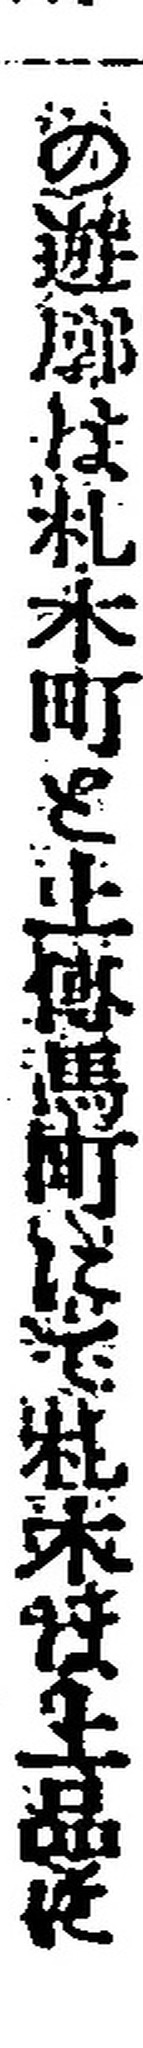の遊廓は札木町と上伝馬町にて札木は上品に
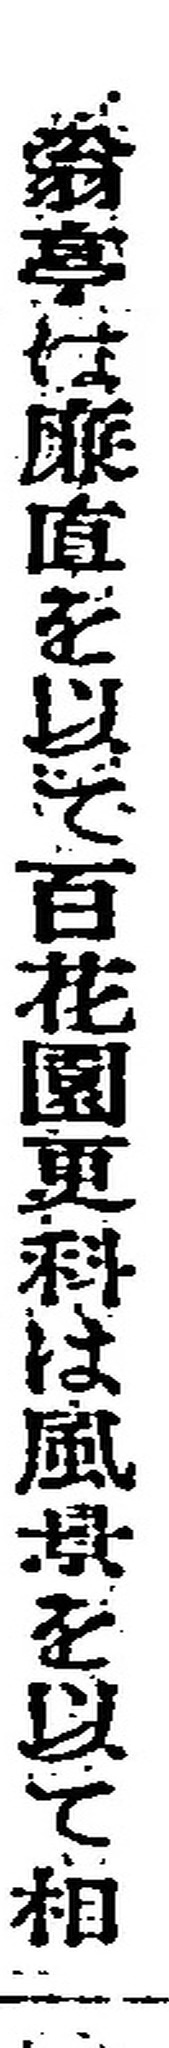翁亭は廉直を以て百花園更科は風景を以て相
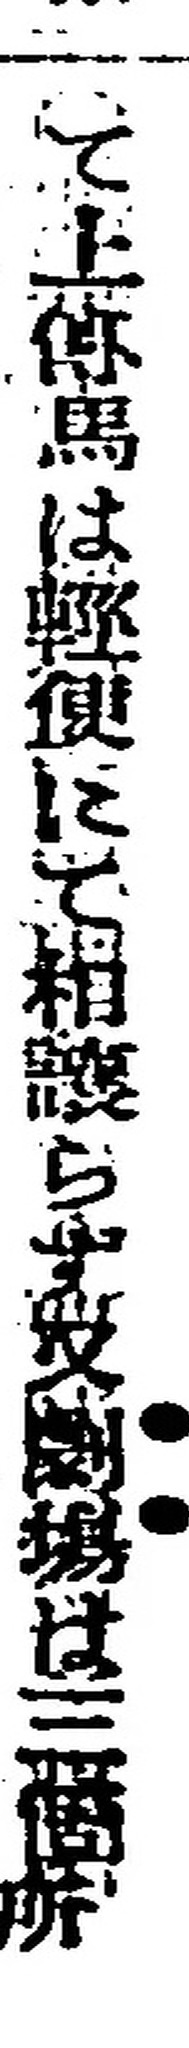て上伝馬は軽便にて相譲らず又劇場は三箇所
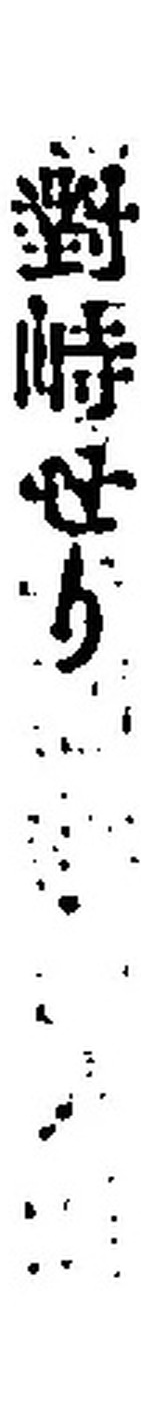対峙せり
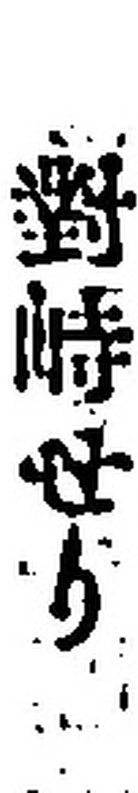対峙せり
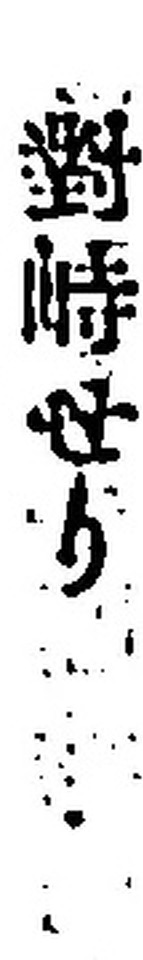対峙せり
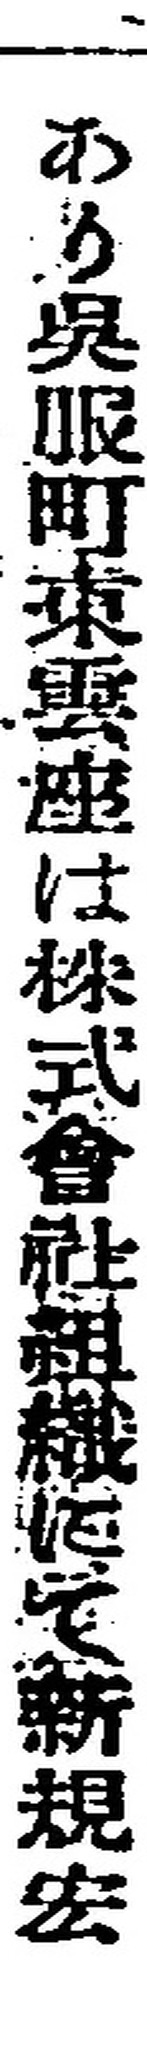あり呉服町東雲座は株式会社組織にて新規宏
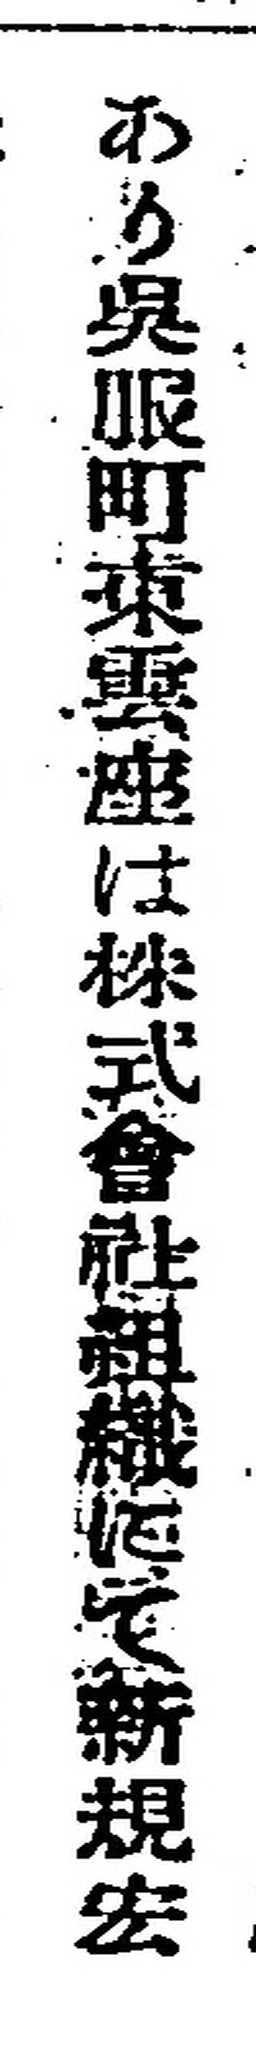あり呉服町東雲座は株式会社組織にて新規宏
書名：東参名勝案内
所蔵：国立国会図書館 National Diet Library, JAPAN
